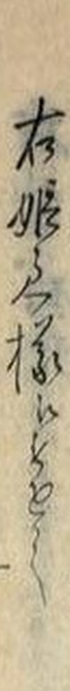右姫君様江被進之
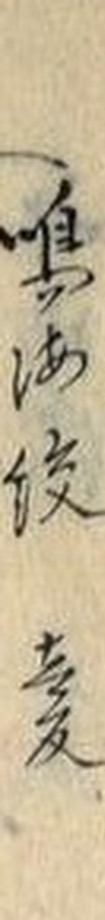鳴海絞壱反
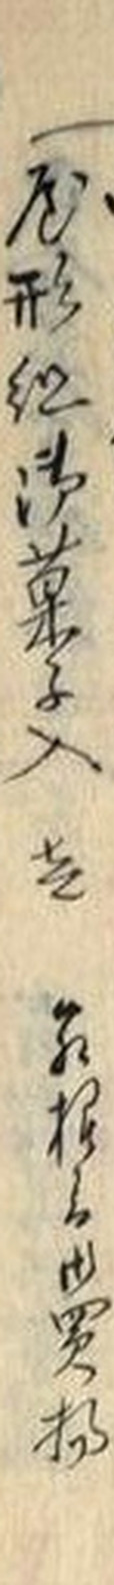屋形組御菓子入壱箱根ニ而御買揚
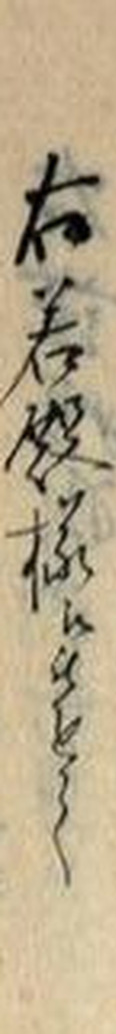右若殿様江被進之
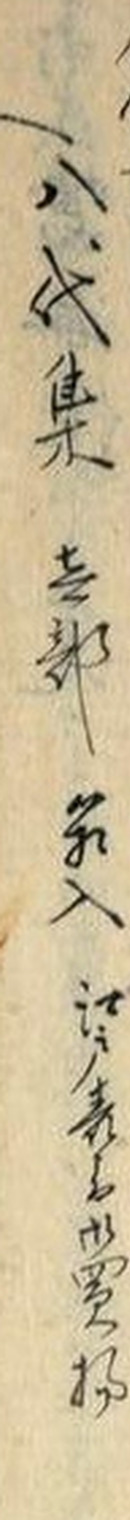八代集壱部箱入江戸表ニ而御買揚

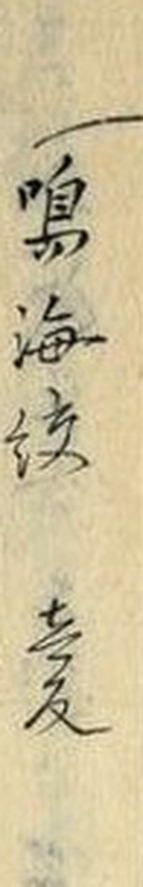鳴海絞壱反
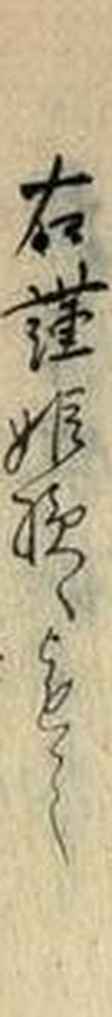右謹姫様へ被進之
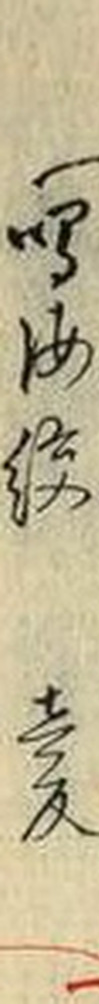鳴海絞壱反
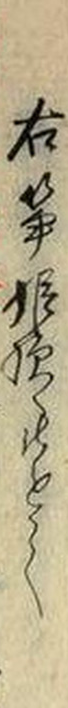右箏姫様へ被進之
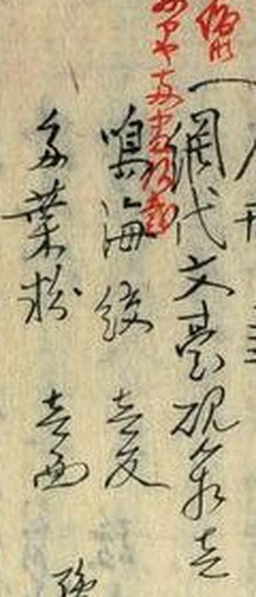鳴海絞壱反
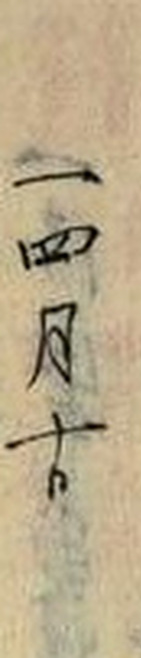一四月十日
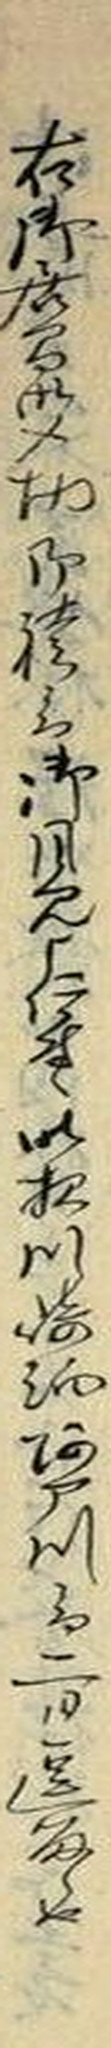右御居間〆切御袴ニ而御目見被仰付候昨夜川崎泊阿部川ニ而二日逗留候由
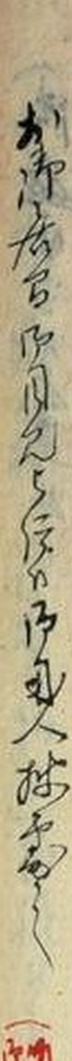於御居間御目見被仰付御用人披露之
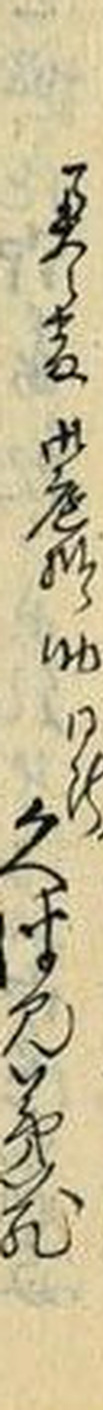同断奥之番御庭掛り助同断久津見第蔵
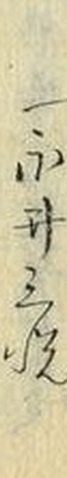永井三悦
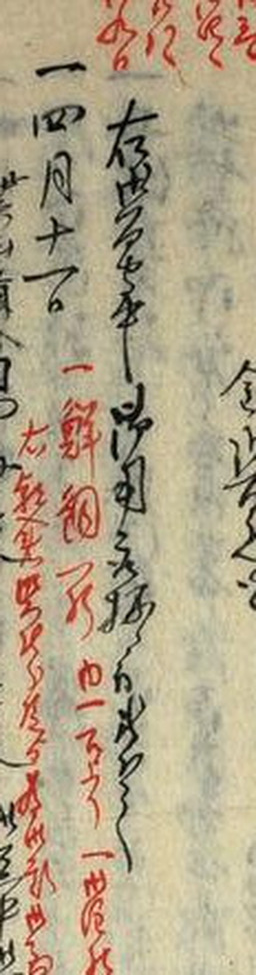右御留守中御用取扱候ニ付被下之
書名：少傅日録抄（斉承付側向頭取日記、在府）
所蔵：福井県文書館 Fukui Prefectural Archives
